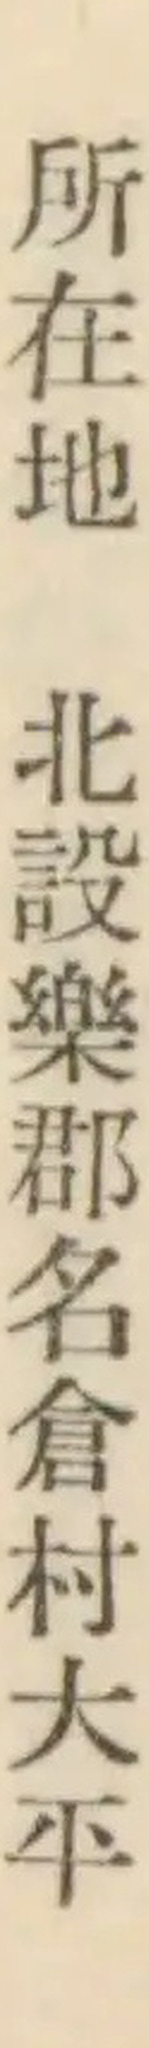所在地北設楽郡名倉村大平
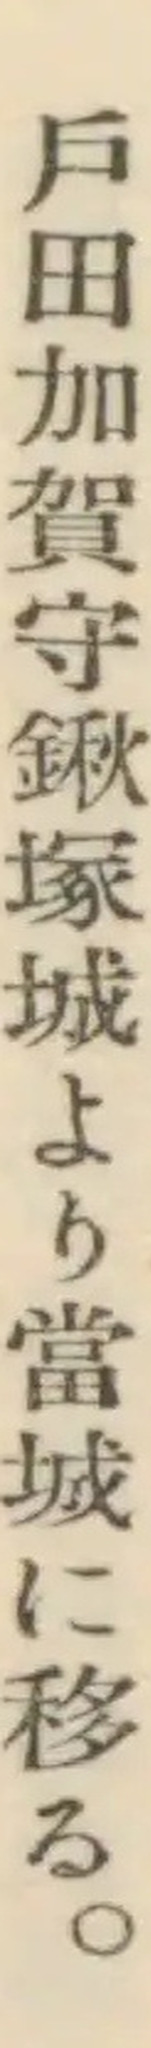戸田加賀守鍬塚城より当城に移る。
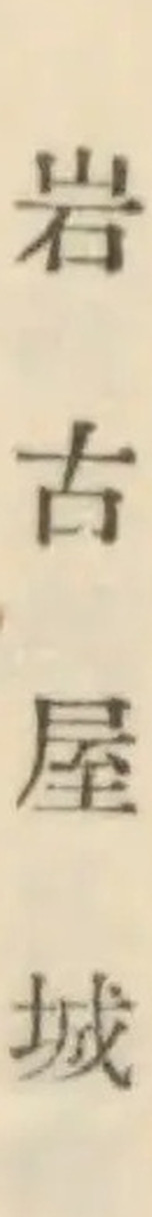岩古屋城
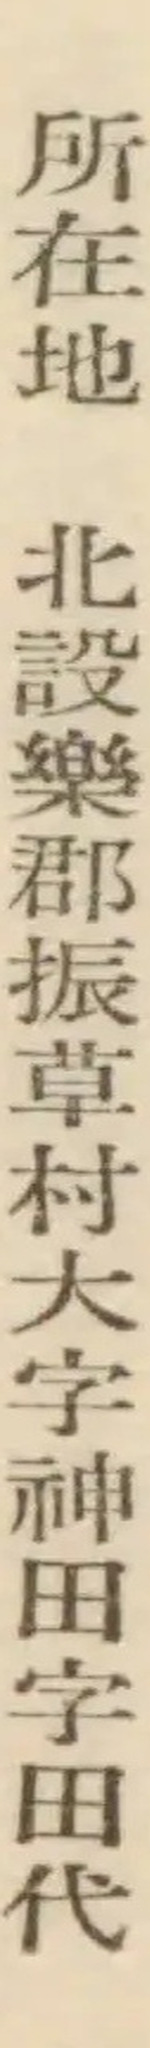所在地北設楽郡振草村大字神田字田代
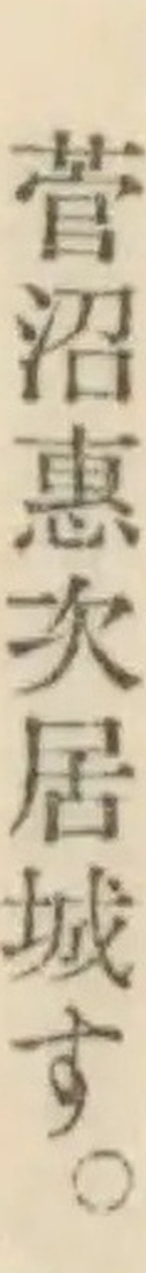菅沼恵次居城す。
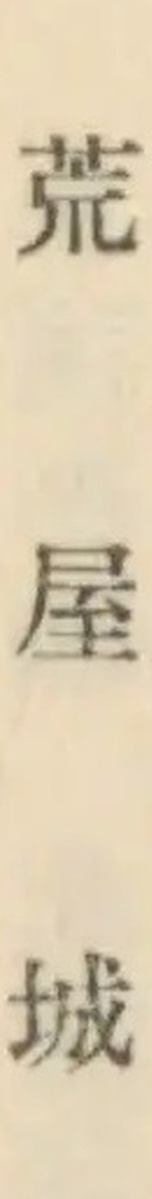荒屋城
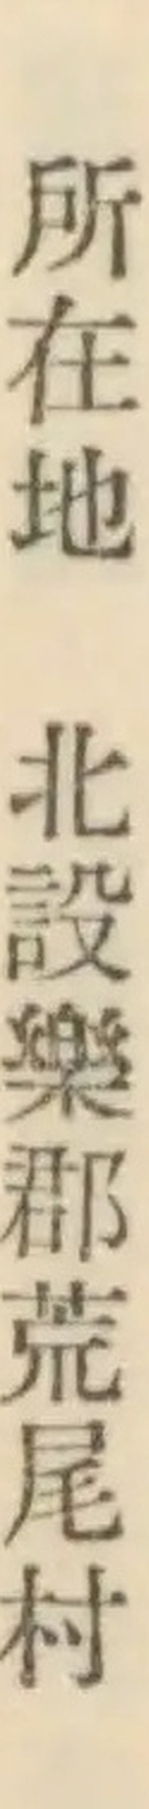所在地北設楽郡荒尾村
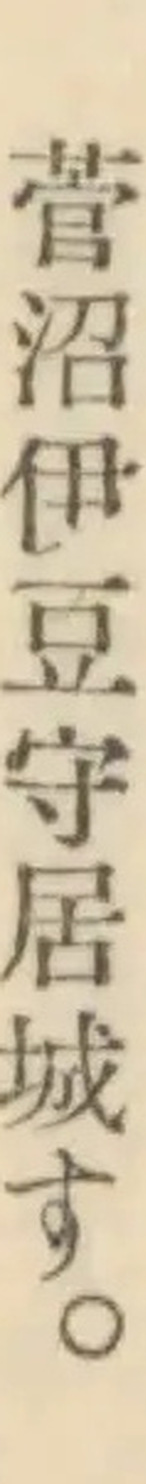菅沼伊豆守居城す。
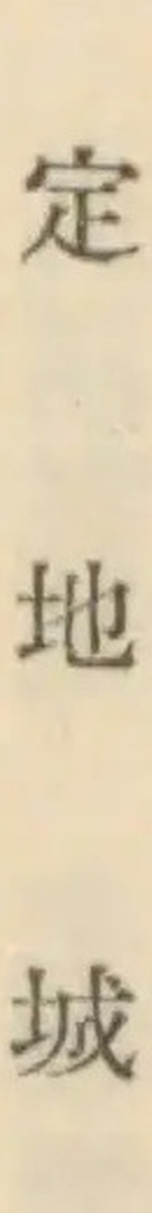定地城
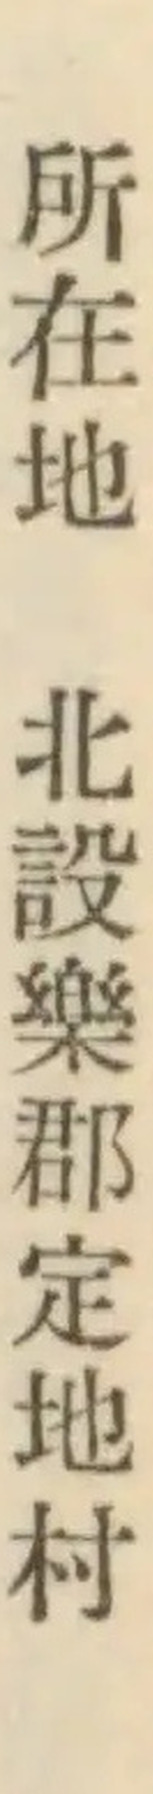所在地北設楽郡定地村
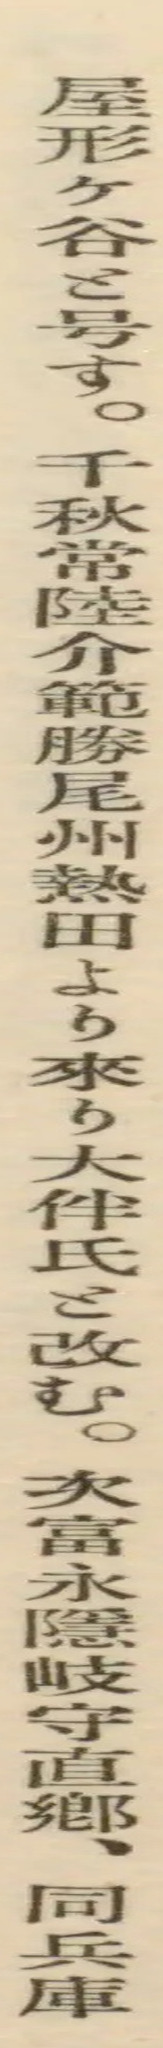屋形ケ谷と号す。千秋常陸介範勝尾州熱田より来り大伴氏と改む。次富永隠岐守直郷、同兵庫

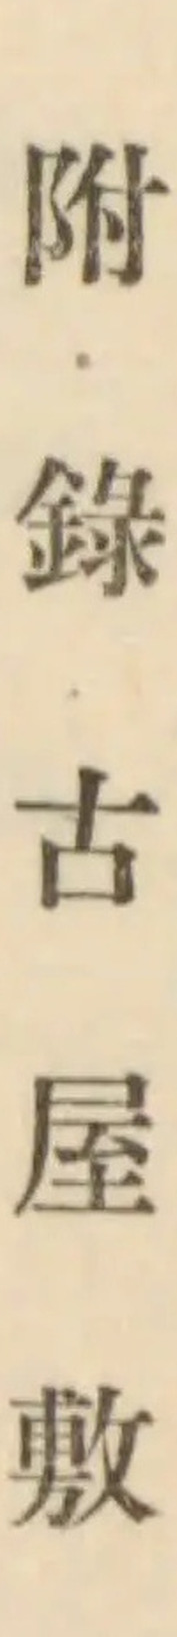附録古屋敷
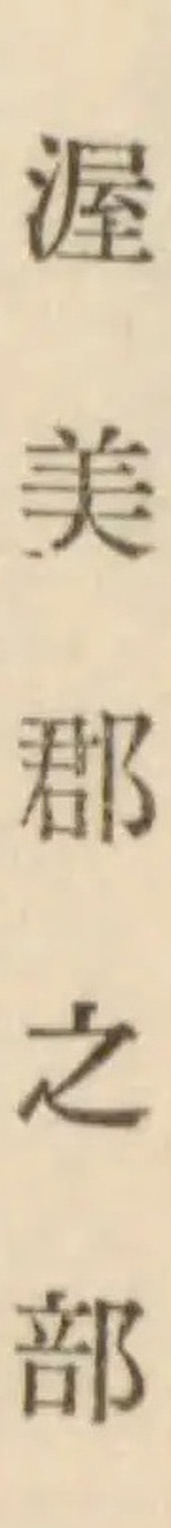渥美郡之部
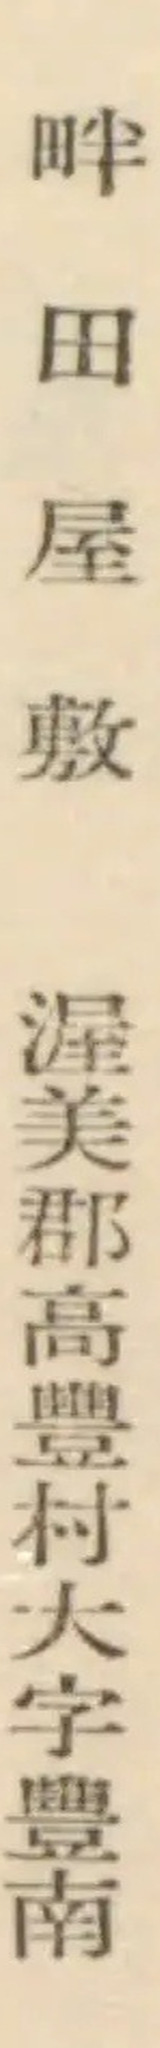畔田屋敷渥美郡高豊村大字豊南
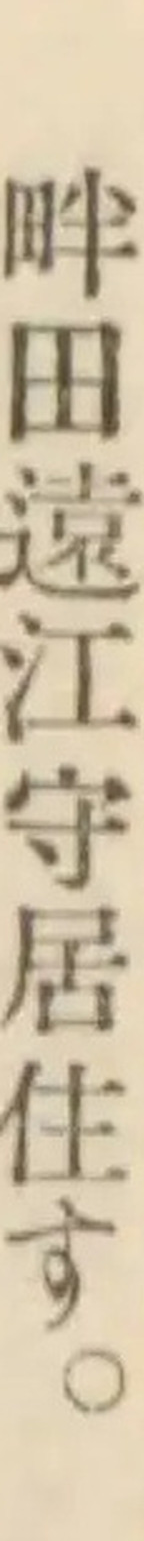畔田遠江守居住す。
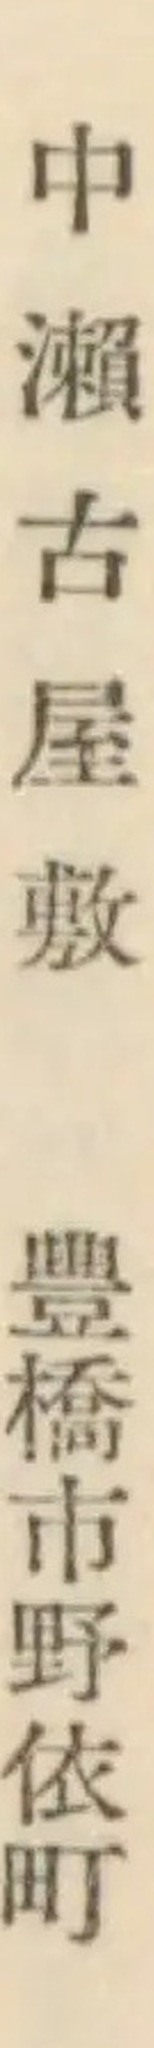中瀬古屋敷豊橋市野依町
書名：東三河之古城
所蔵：国立国会図書館 National Diet Library, JAPAN
